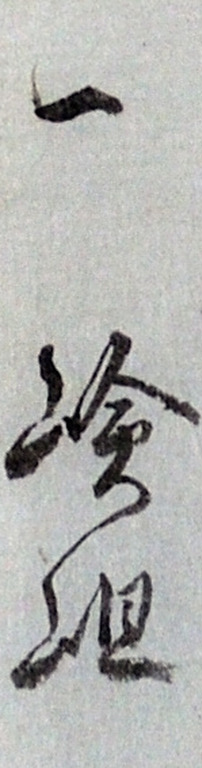一嶮岨

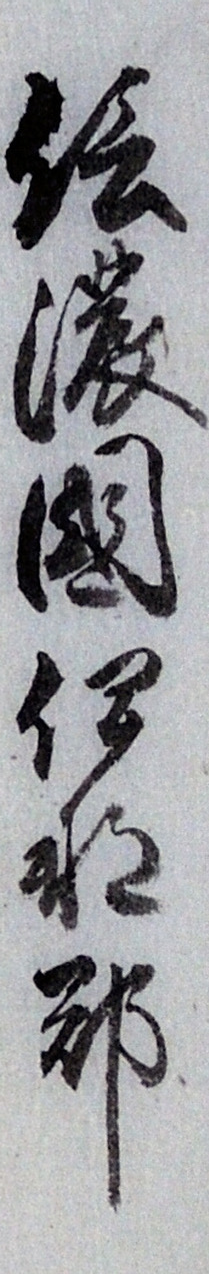信濃国伊那郡
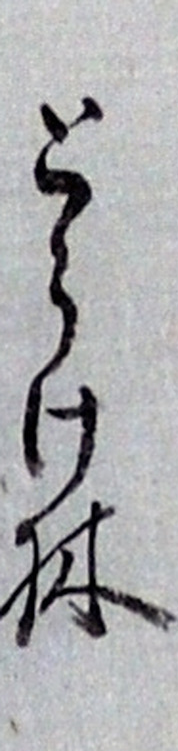とうけ林
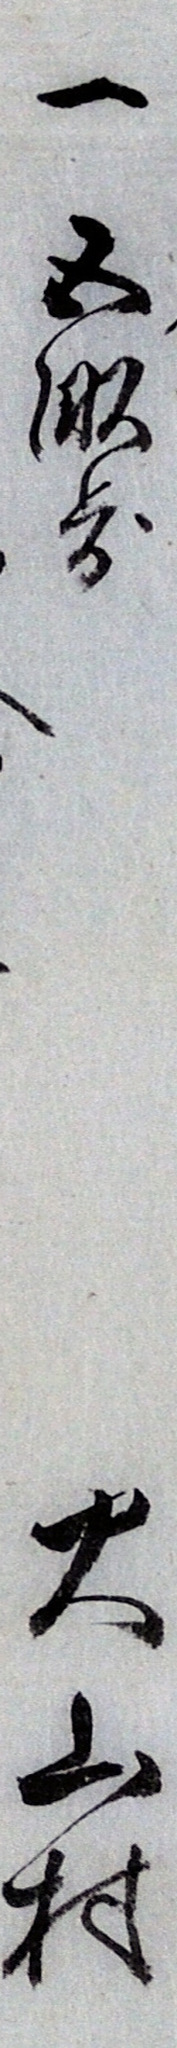一五㽗歩火山村
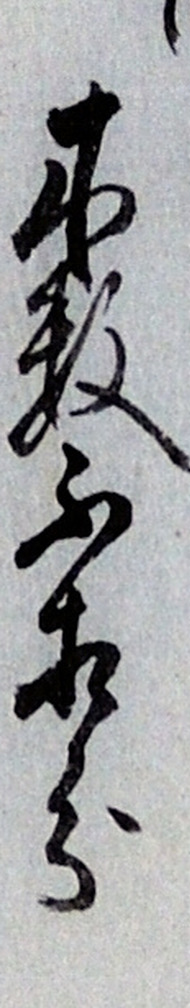木数不相分
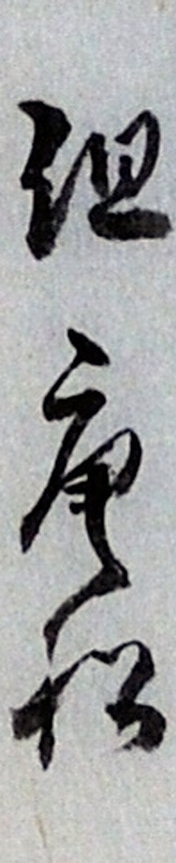但唐松
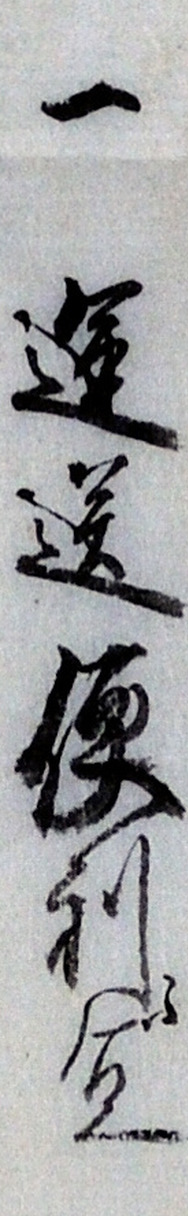一運送便利不宜
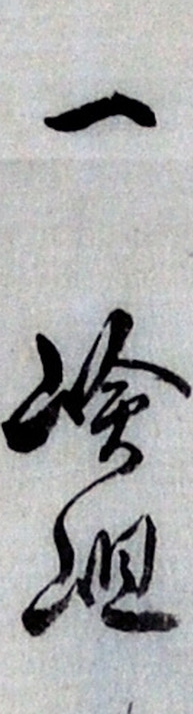一嶮岨

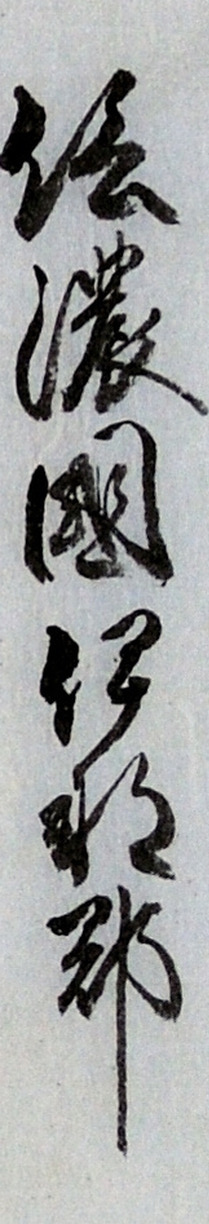信濃国伊那郡
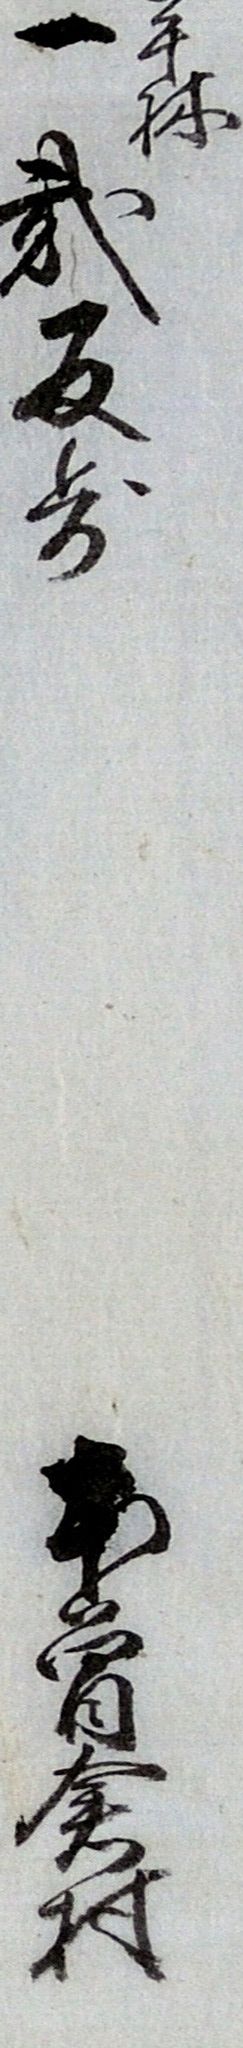一弐反歩本曽倉村
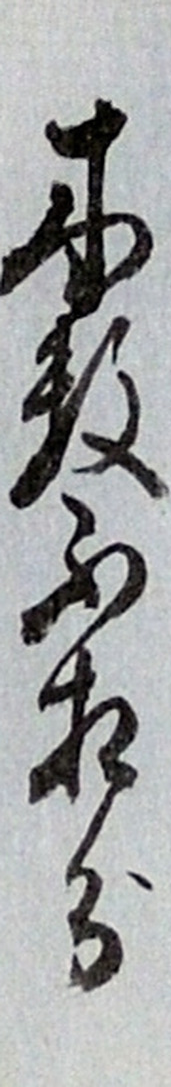木数不相分
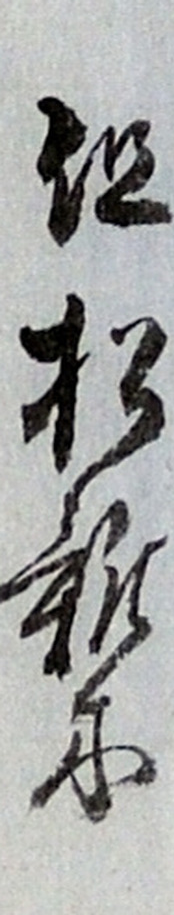但松雑木
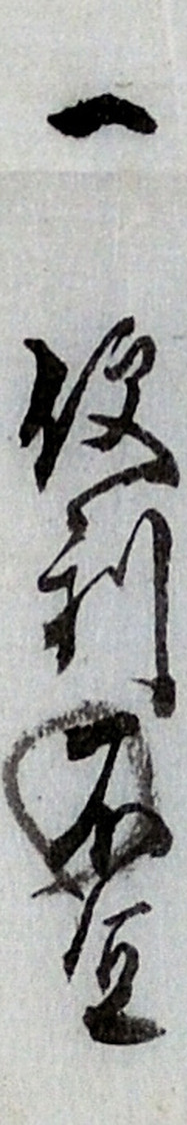一便利不宜

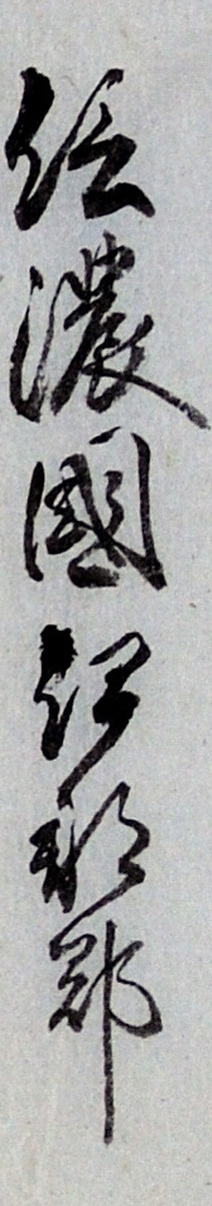信濃国伊那郡
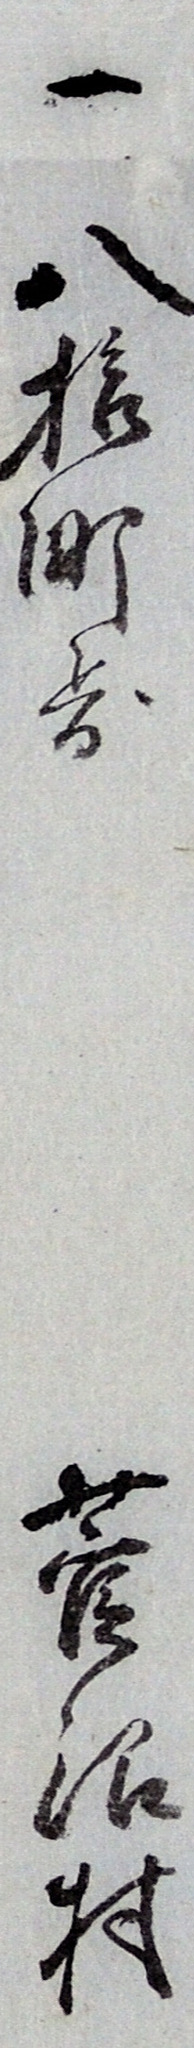一八拾町歩菅沼村
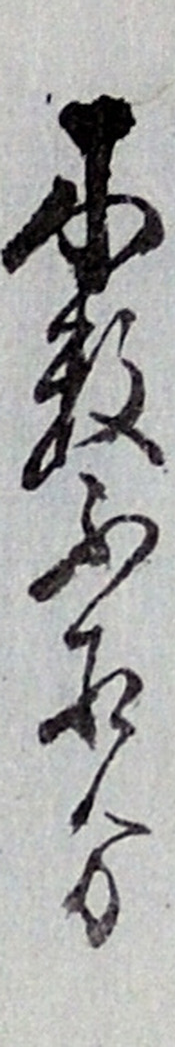木数不相分
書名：官林反別帳
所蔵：伊那市立高遠町図書館・合同会社AMANE
